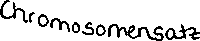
Chromosomensatz
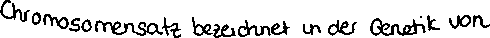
Chromosomensatz bezeichnet in der Genetik von
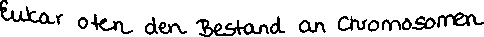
Eukaryoten den Bestand an Chromosomen
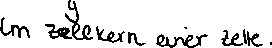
im Zellkern einer Zelle.
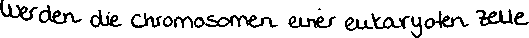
Werden die Chromosomen einer eukaryoten Zelle
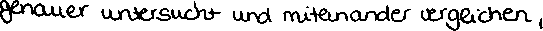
genauer untersucht und miteinander verglichen,
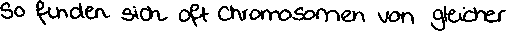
so finden sich oft Chromosomen von gleicher
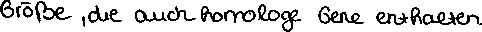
Größe, die auch homologe Gene enthalten
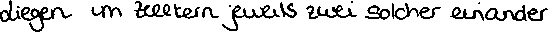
Liegen im Zellkern jeweils zwei solcher einander
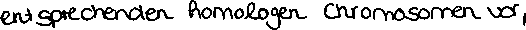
entsprechenden homologen Chromosomen vor,
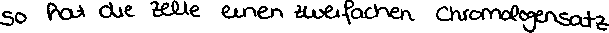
so hat die Zelle einen zweifachen Chromosomensatz
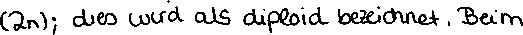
(2n); dies wird als diploid bezeichnet. Beim
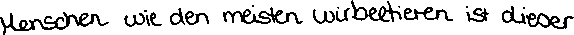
Menschen wie den meisten Wirbeltieren ist dieser
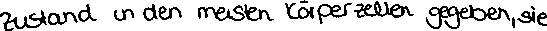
Zustand in den meisten Körperzellen gegeben, sie
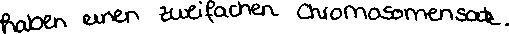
haben einen zweifachen Chromosomensatz.
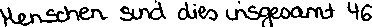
Menschen sind dies insgesamt 46
